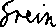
Grein
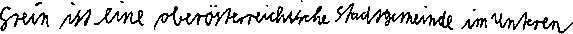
Grein ist eine oberösterreichische Stadtgemeinde im Unteren
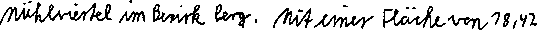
Mühlviertel im Bezirk Perg. Mit einer Fläche von 18,42
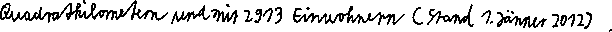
Quadratkilometern und mit 2913 Einwohnern (Stand 1. Jänner 2022)
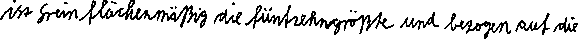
ist Grein flächenmäßig die fünfzehntgrößte und bezogen auf die
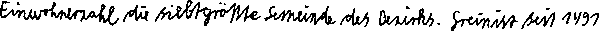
Einwohneranzahl die siebtgrößte Gemeinde des Bezirks. Grein ist seit 1491
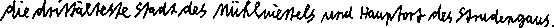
die drittälteste Stadt des Mühlviertels und Hauptort des Strudengaus.
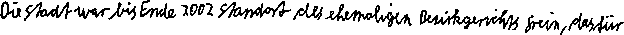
Die Stadt war bis Ende 2002 Standort des ehemaligen Bezirksgerichts Grein, das für
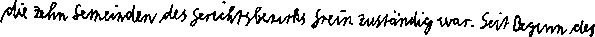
die zehn Gemeinden des Gerichtsbezirks Grein zuständig war. Seit Beginn des
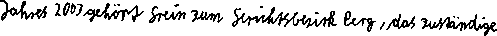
Jahres 2003 gehört Grein zum Gerichtsbezirk Perg, das zuständige
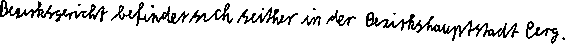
Bezirksgericht befindet sich seither in der Bezirkshauptstadt Perg.
